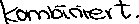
kombiniert.
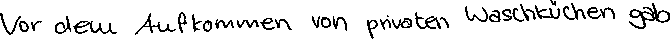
Vor dem Aufkommen von privaten Waschküchen gab
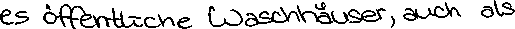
es öffentliche Waschhäuser, auch als
